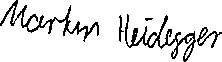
Martin Heidegger
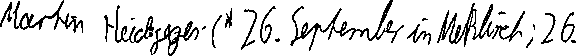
Martin Heidegger (* 26. September in Meßkirch; 26.
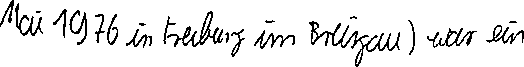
Mai 1976 in Freiburg im Breisgau) war ein
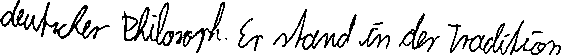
deutscher Philosoph. Er stand in der Tradition
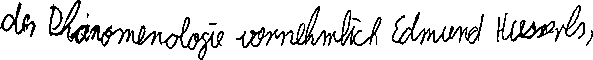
der Phänomenologie vornehmlich Edmund Husserls,
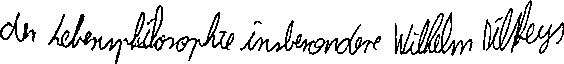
der Lebensphilosophie insbesondere Wilhelm Diltheys
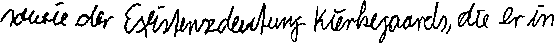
sowie der Existenzdeutung Kierkegaards, die er in
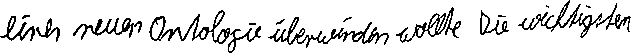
einer neuen Ontologie überwinden wollte. Die wichtigsten
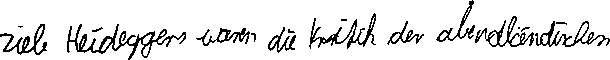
Ziele Heideggers waren die Kritik der abendländischen
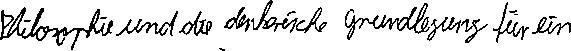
Philosophie und die denkerische Grundlegung für ein
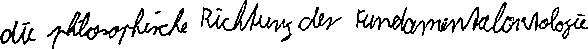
die philosophische Richtung der Fundamentalontologie
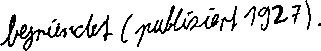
begründete (publiziert 1927).
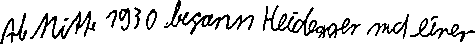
Ab Mitte 1930 begann Heidegger mit einer
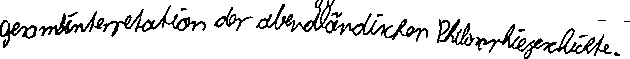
Gesamtinterpretation der abendländischen Philosophiegeschichte.
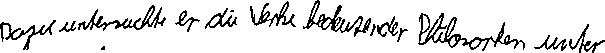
Dazu untersuchte er die Werke bedeutender Philosophen unter
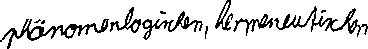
phänomenologischen, hermeneutischen
